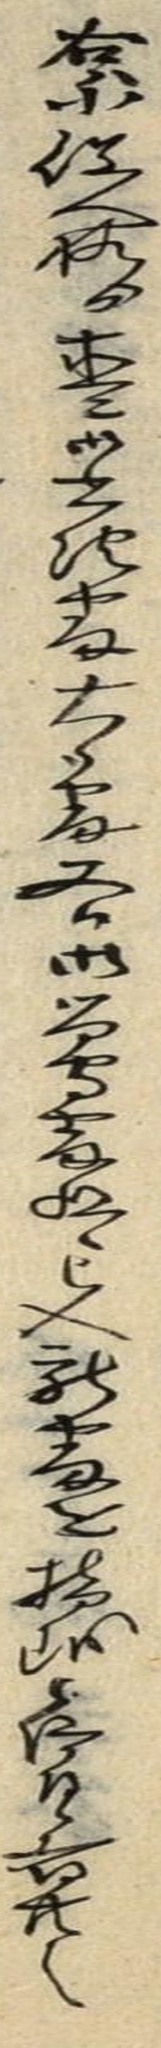右は小役人格ゟ直に御書院番大御番又は御留守番組へ被入新番を指越被仰付候者共之
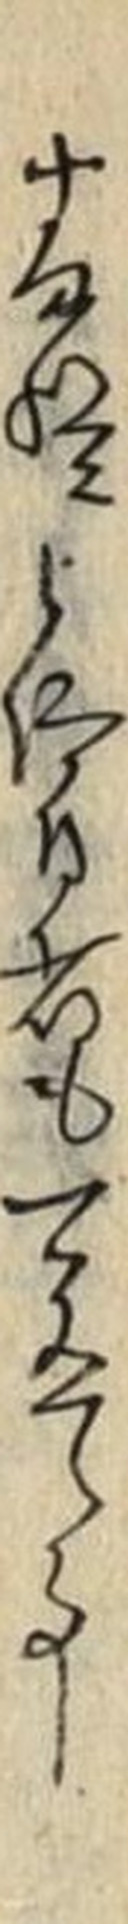番組に被仰付者も可有之事
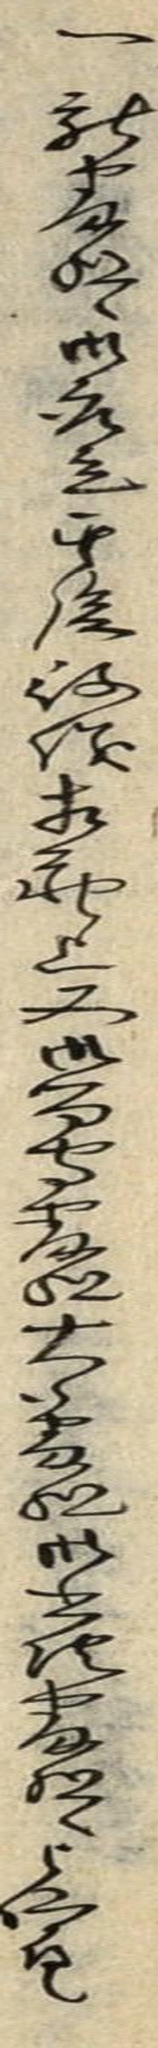一新番組へ御取立其後役儀相勤候上又御留守番組大御番組御書院番組へ被仰付候
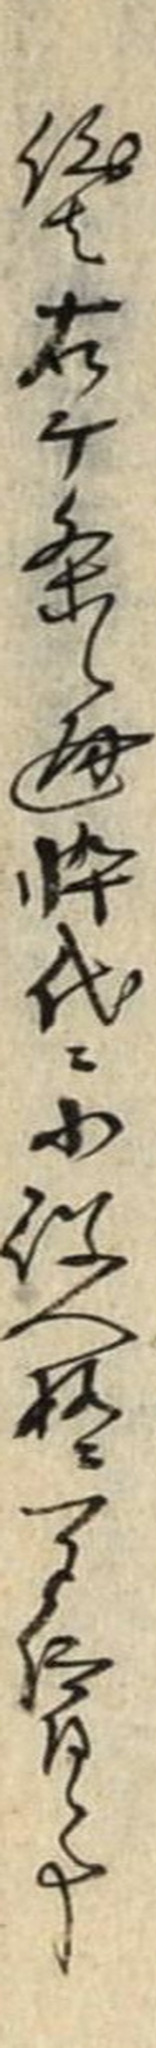儀は右ケ条之通忰代に小役人格に可被仰付事
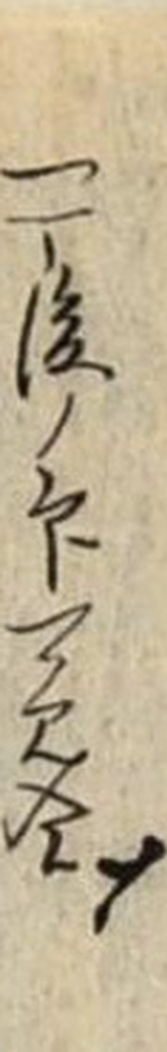一丁後ノ印可見合
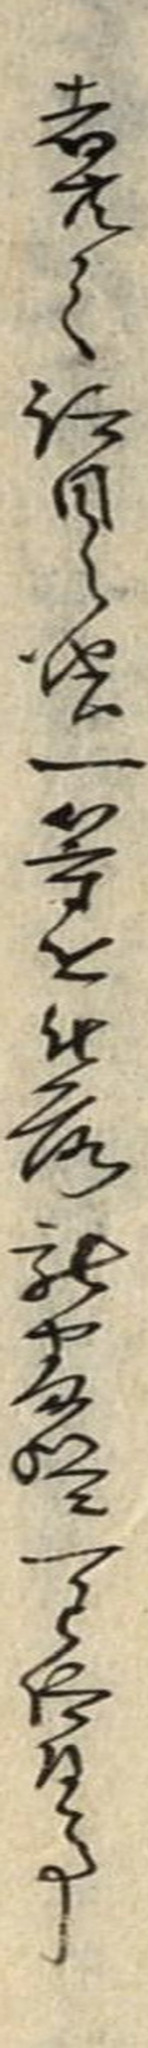者共之跡目之儀は一等を被落新番組に可被仰付事
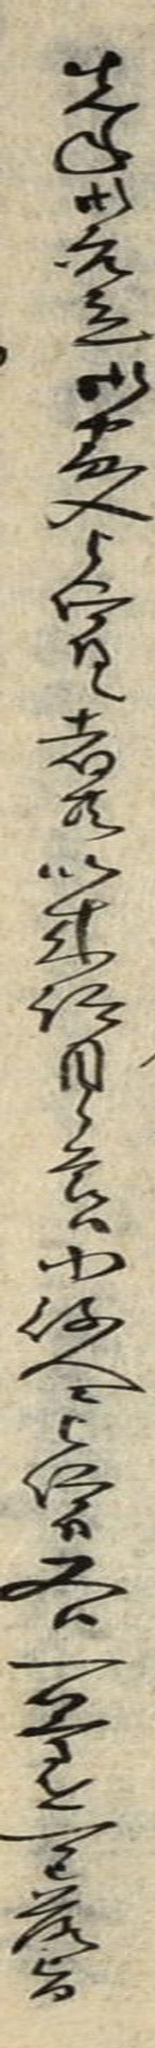先年御取立御番入被仰付候者共以来跡目之節は小役人に被仰付又は一等を可被落旨
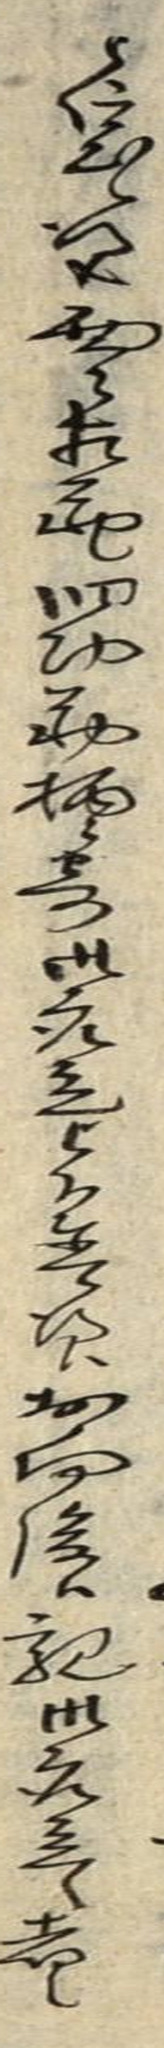被仰出候得共面々相勤候旧功勤柄に寄御取立被下置候得は於向後は親御取立之者之
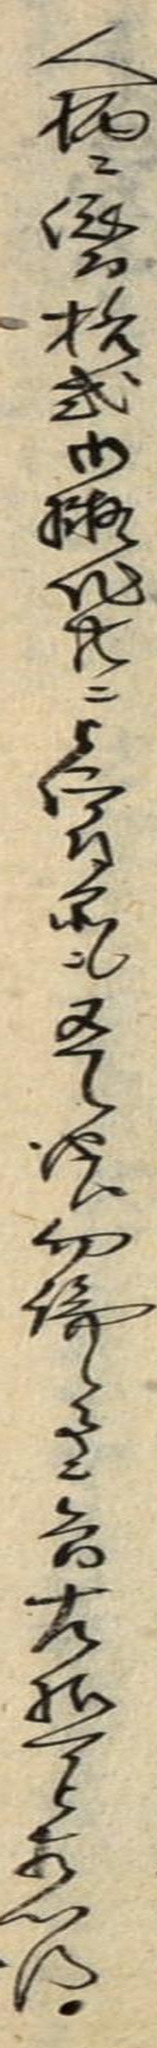人柄に依而格式御擬作共に被仰付品も有之儀は勿論之事に候間左様可被相心得
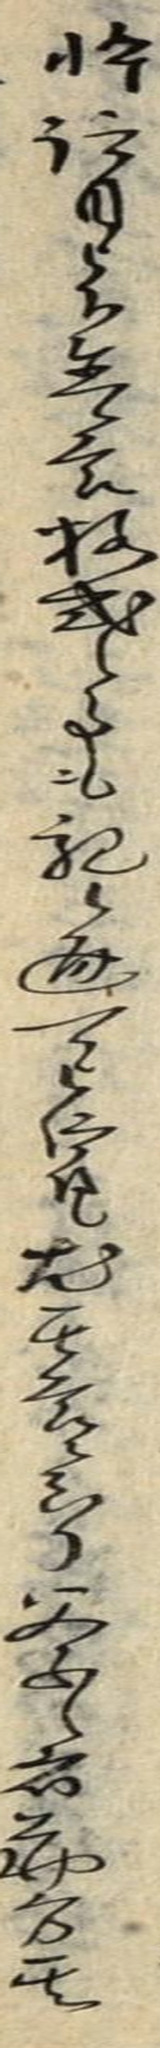忰跡目被下置候節格式之事も親之通可被仰付候尤其節に至り父子之者勤方其

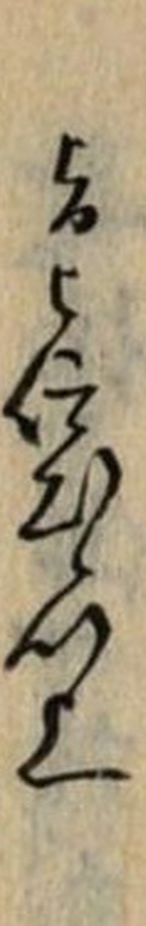旨被仰出候以上
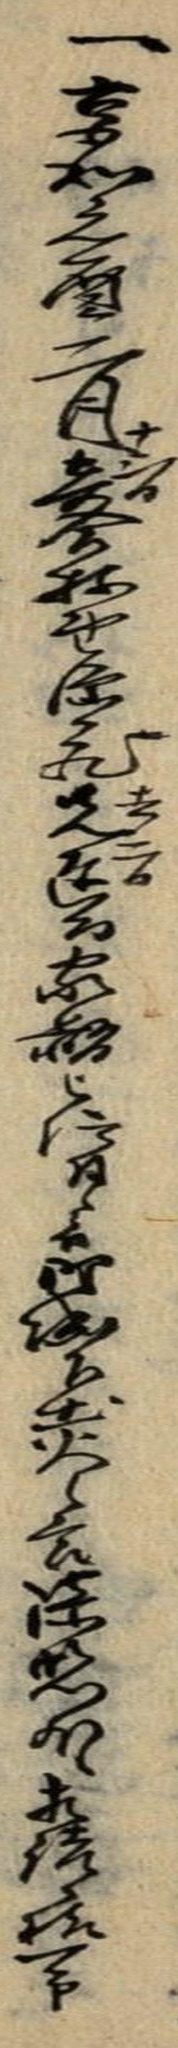一享和元酉二月十三日寄合牧野源蔵先達而家督被仰付候に付御城下出火之節漆御門外へ相詰候様可申
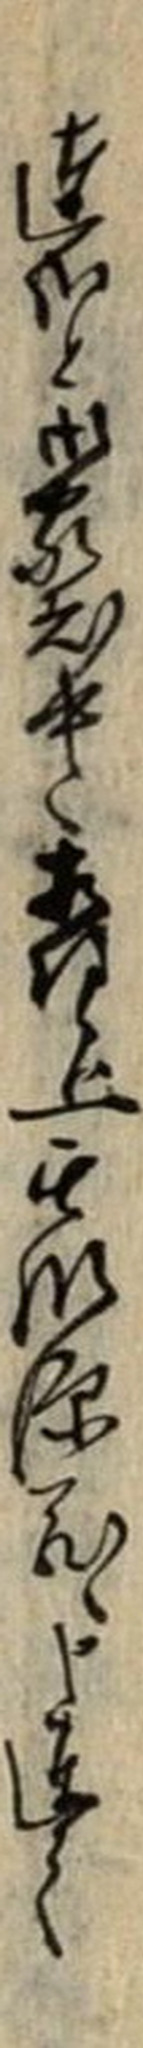達哉と御家老中へ相伺候上其段源蔵へ申達之
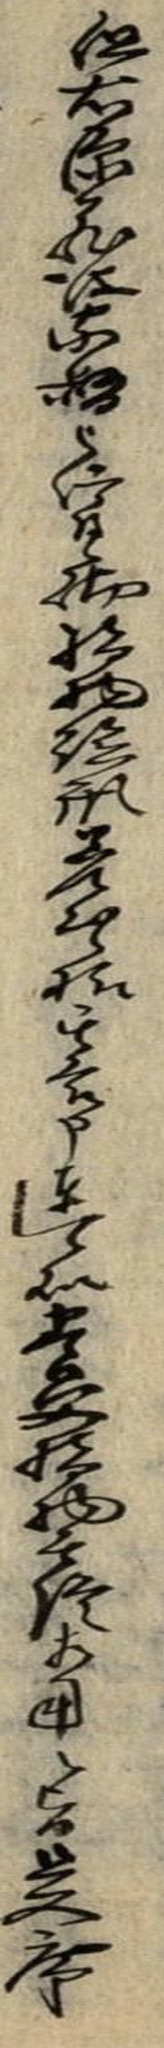但右源蔵儀家督被仰付候砌指物絵形差出候様其節申達候処養父指物其侭相用候旨且又席
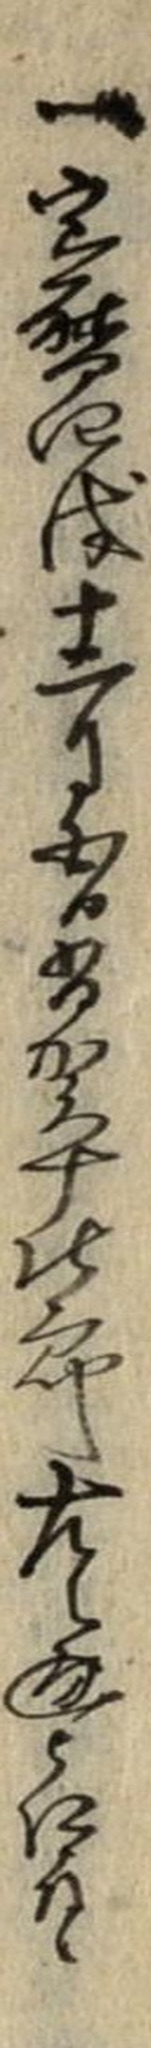一宝暦四戌十二月五日有賀十次郎左之通被仰付候
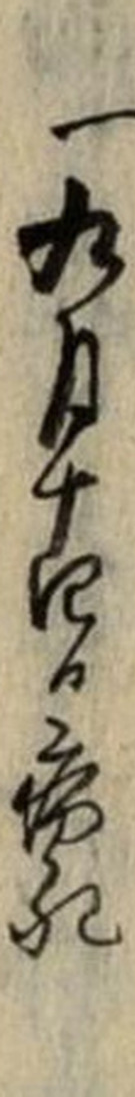九月十四日病死
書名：御用并被仰出之部
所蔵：福井県文書館 Fukui Prefectural Archives
